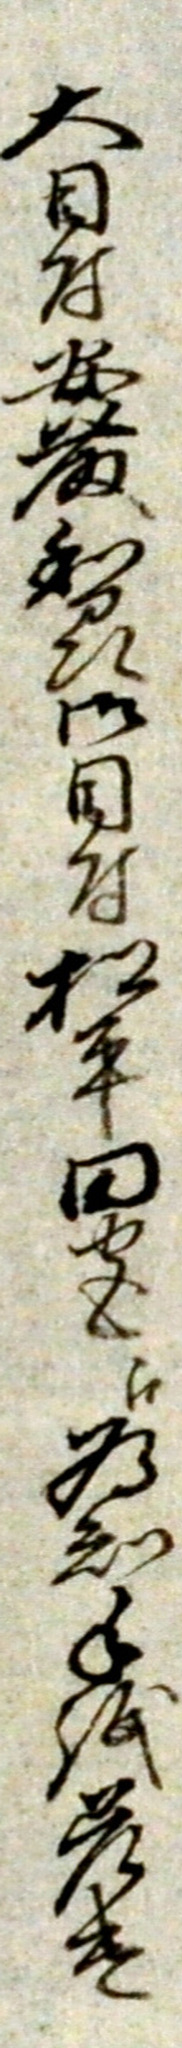大目付安藤智頭御目付松平田宮江為知手紙差遣
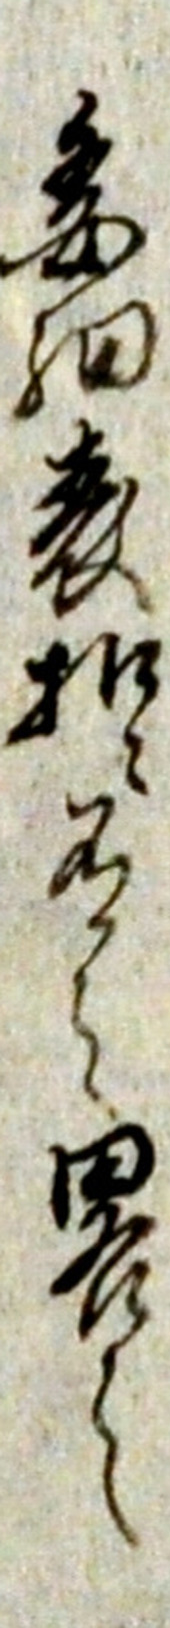委細表扣ニ有之略之
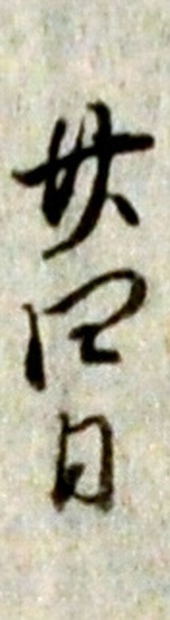廿四日
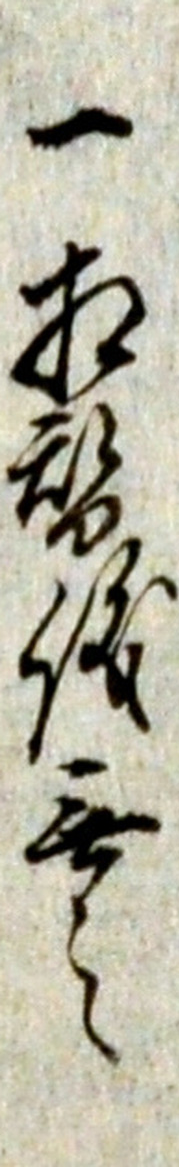一相替儀無之
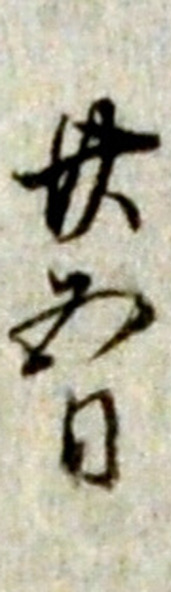廿五日
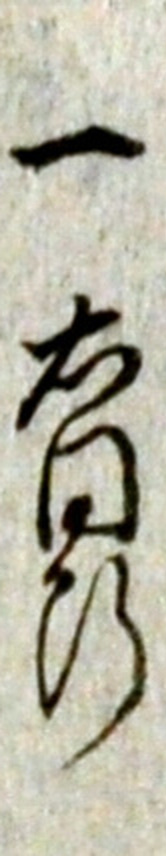一右同断
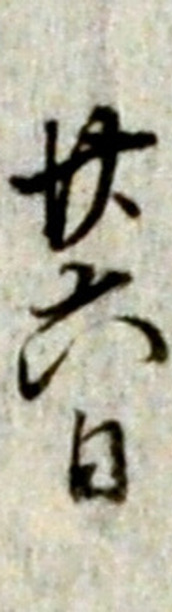廿六日
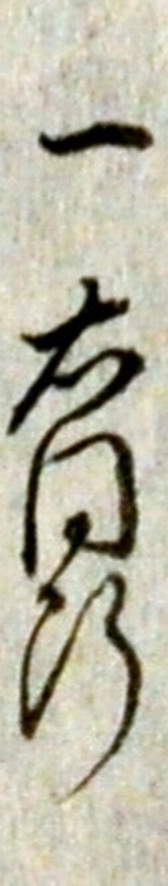一右同断
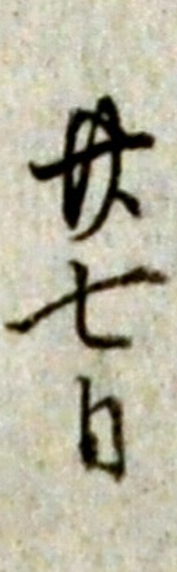廿七日
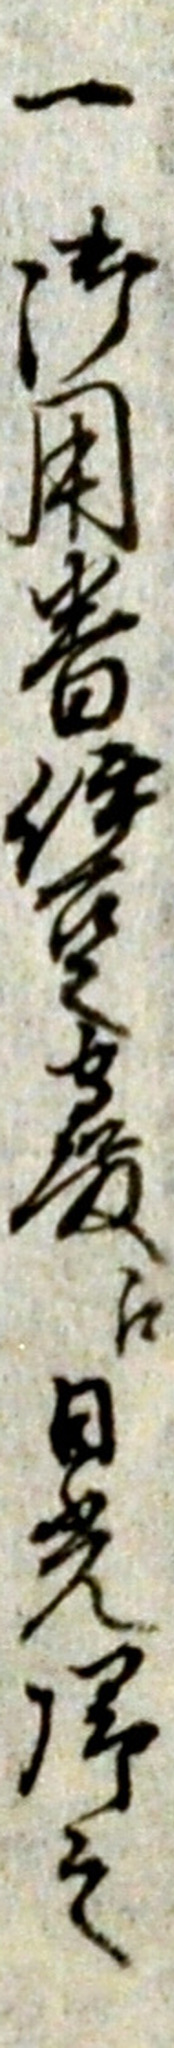一御用番伊豆守殿江日光帰之
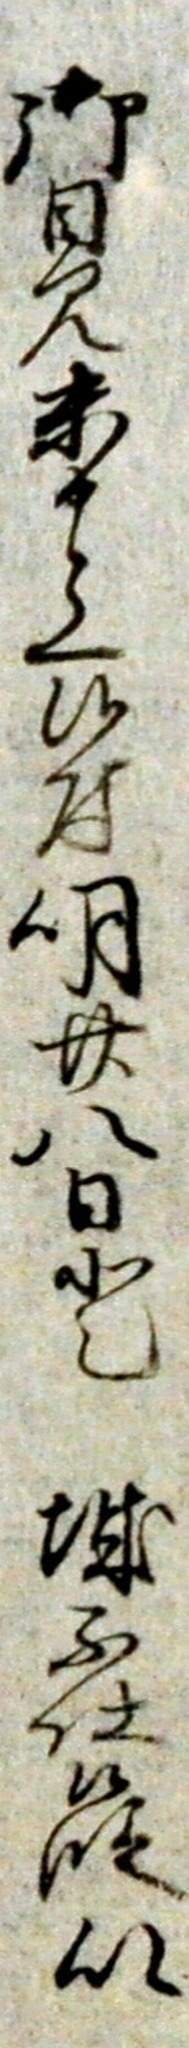御目見等申上候付明二十八日登城不仕候段以
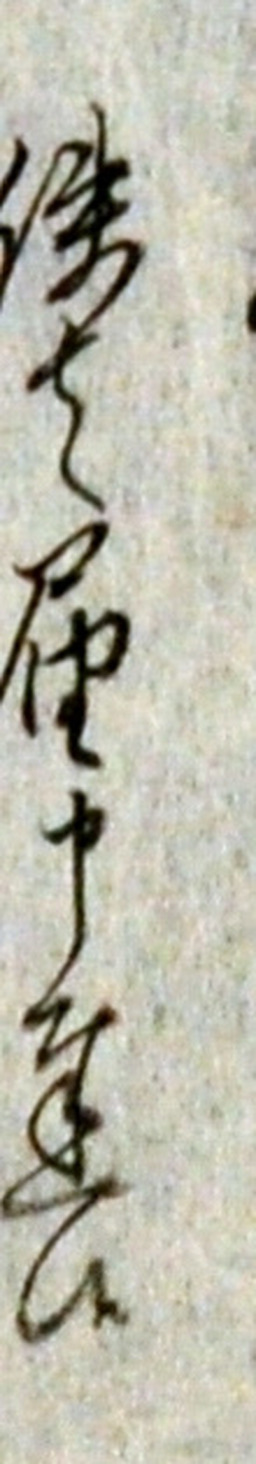使者届申達候

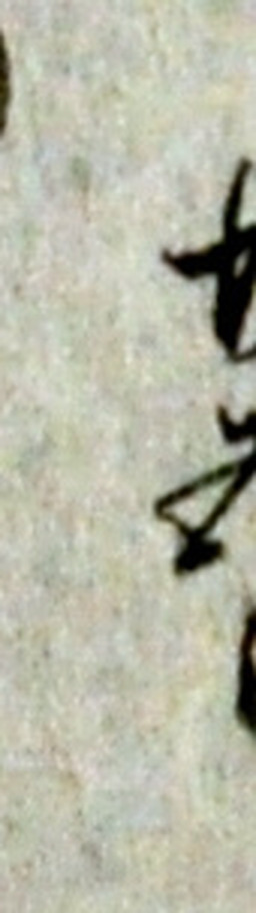廿六日
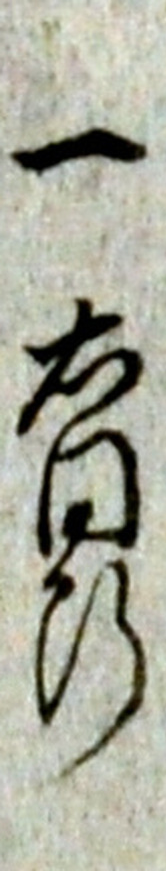一右同断
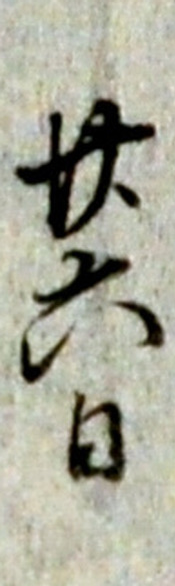廿六日
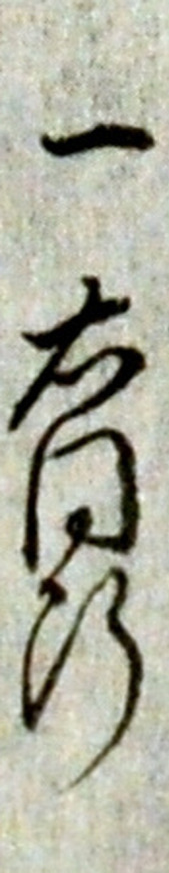一右同断
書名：日光御名代相勤候節ノ留
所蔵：伊那市立高遠町図書館・合同会社AMANE
